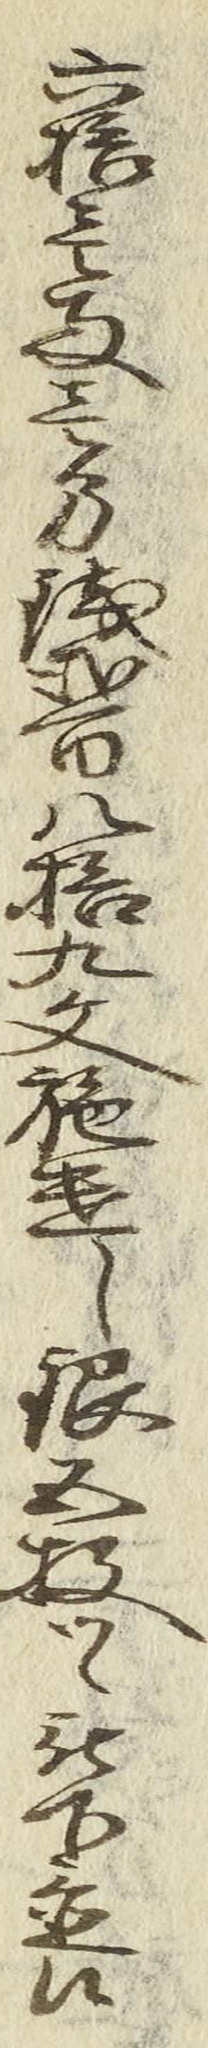六拾壱両壱分銭弐百八拾九文施遣し銀五枚ツヽ被下置候
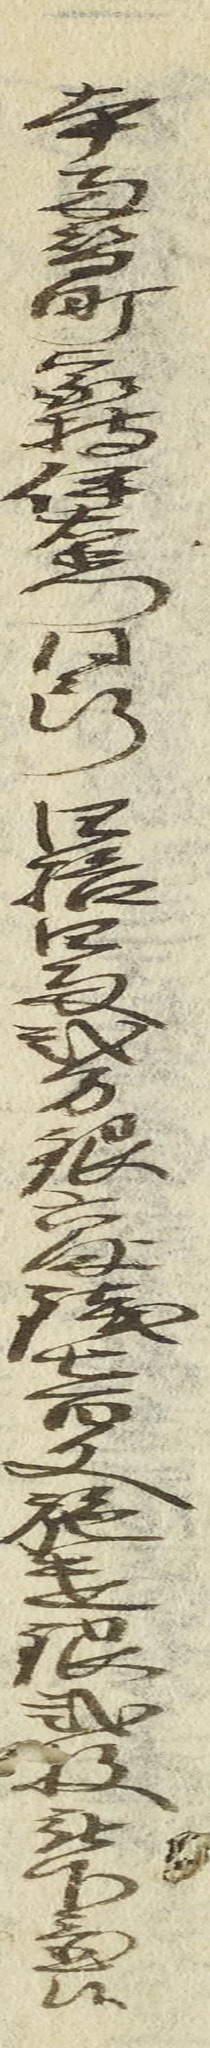一本両替町家持伊右衛門同断四拾四両弐分銀六匁銭七百文施遣銀弐枚被下置候
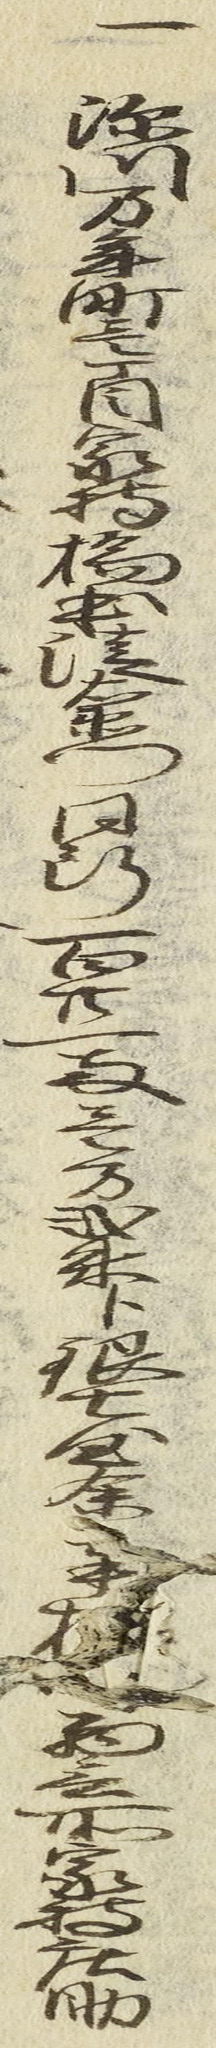一深川万年町壱丁目家持橋本清右衛門同断百廿一両壱分弐朱ト銀七匁余南槙町西会所家持庄助
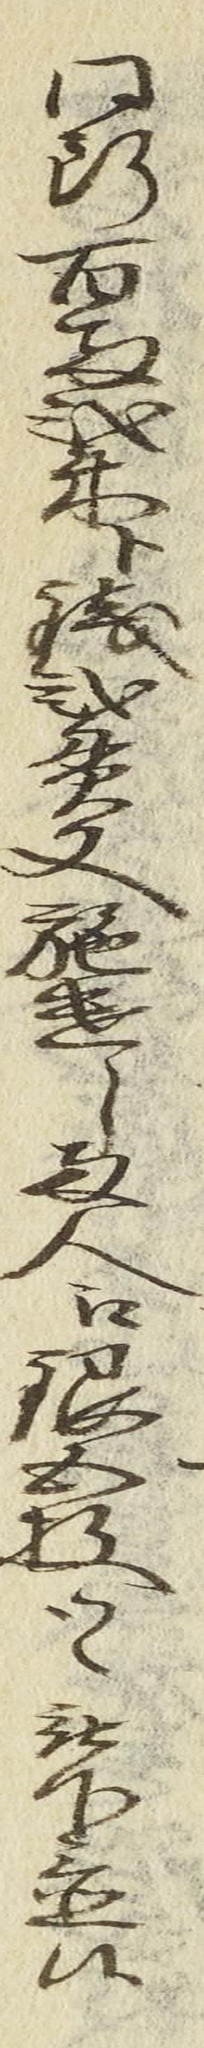同断百両弐朱ト銭弐貫文施遣し両人江銀五枚ツヽ被下置候
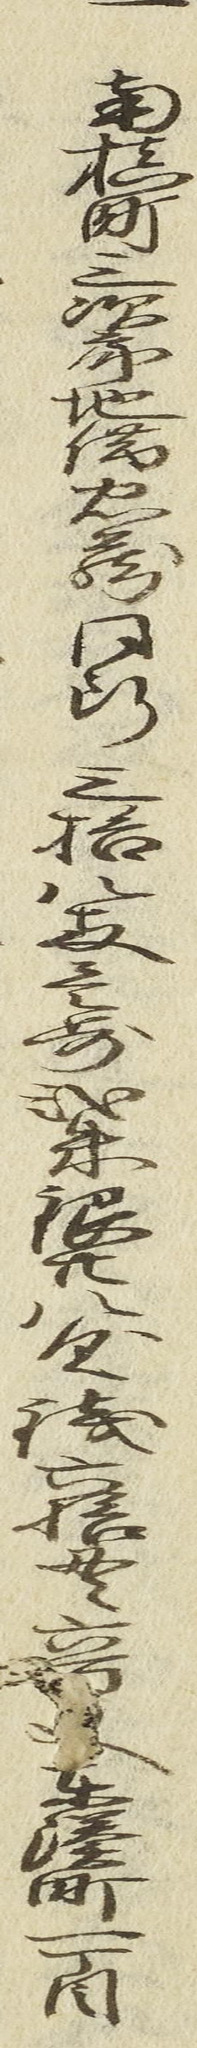一南槙町三次郎地借忠蔵同断三拾八両壱歩弐朱銀廿八匁銭六拾貫六百文東湊町一丁目
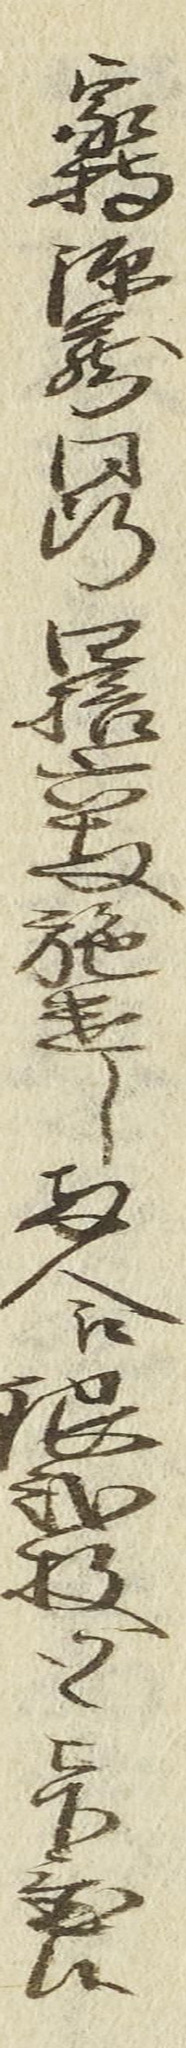家持源蔵同断四拾六両施遣し両人江銀弐枚ツヽ被下置候
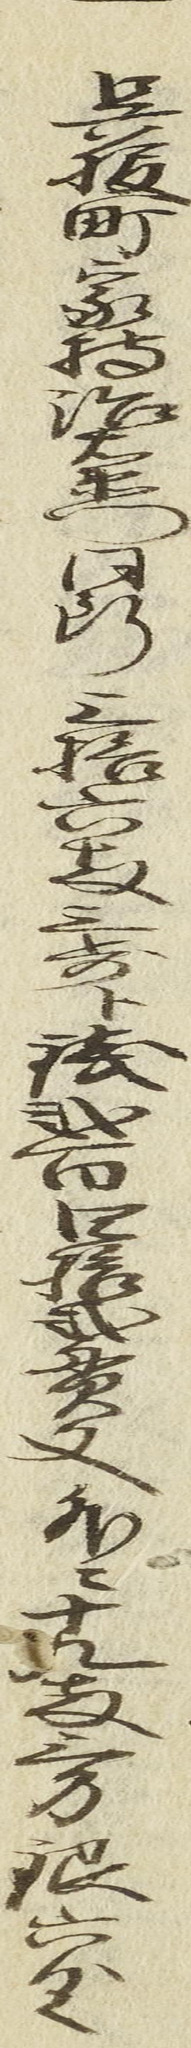一呉服町家持治右衛門同断三拾六両三歩ト銭弐百四拾弐貫文外ニ十九両三分銀六匁
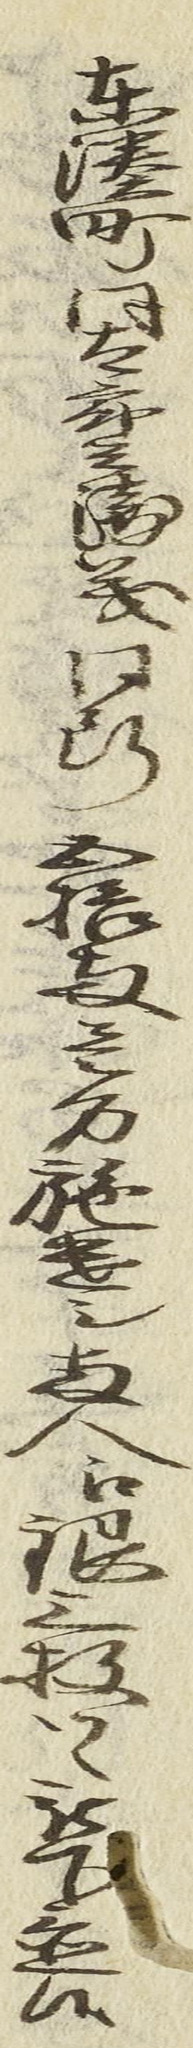東湊町同太郎兵衛義同断五拾両壱分弐施遣シ両人江銀三枚ツヽ被下置候
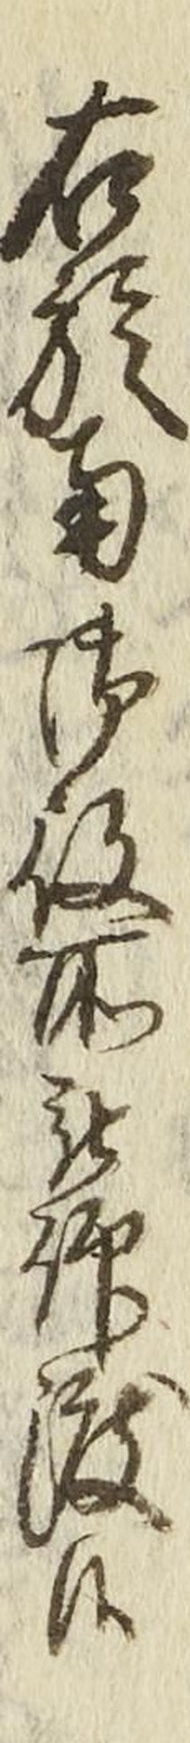右於南御役所被仰渡候
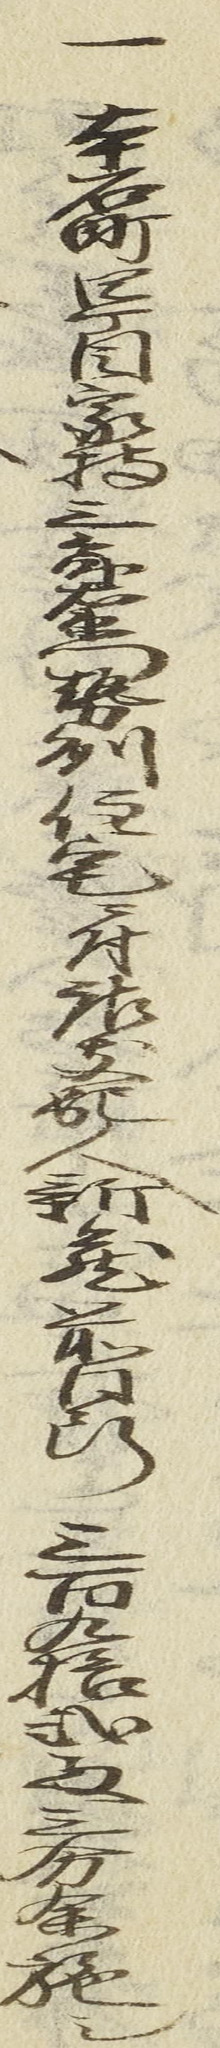一本石町四丁目家持三郎右衛門勢州住宅ニ付店支配人新蔵前同断三百九拾弐両三分余施シ
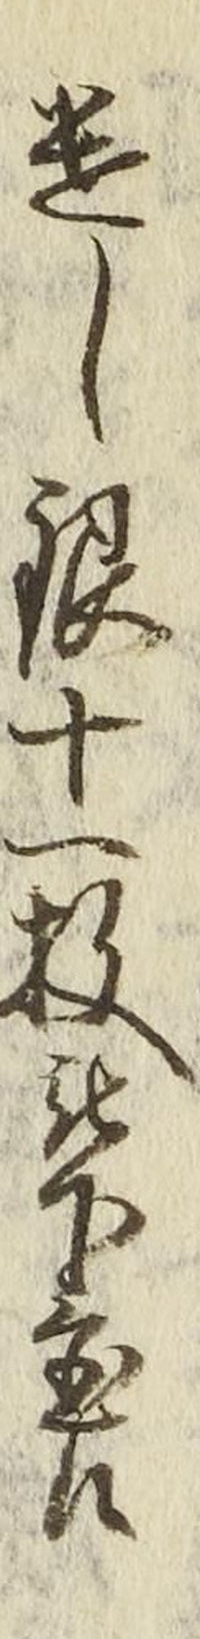遣し銀十一枚被下置候
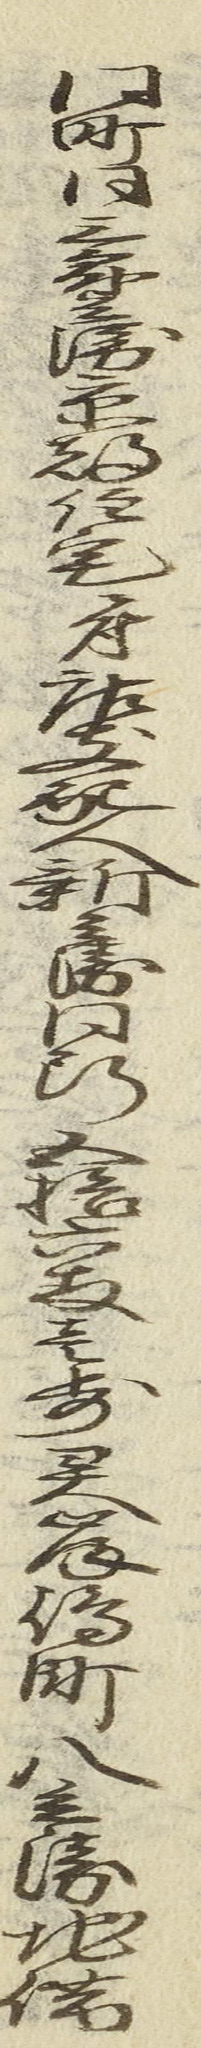一同町同三郎兵衛京都住宅ニ付店支配人新兵衛同断五拾六両壱分霊岸嶋町八兵衛地借
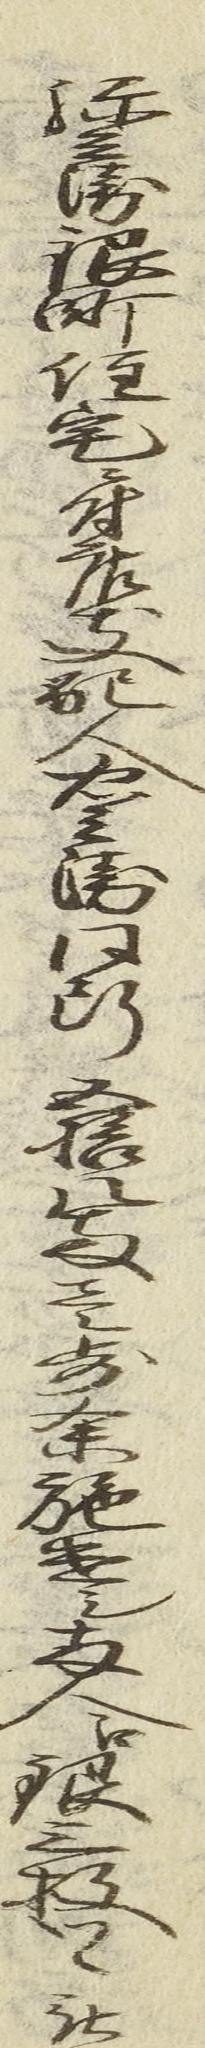弥兵衛銀町住宅ニ付店支配人忠兵衛同断五拾八両壱歩余施遣シ両人江銀三枚ツヽ被
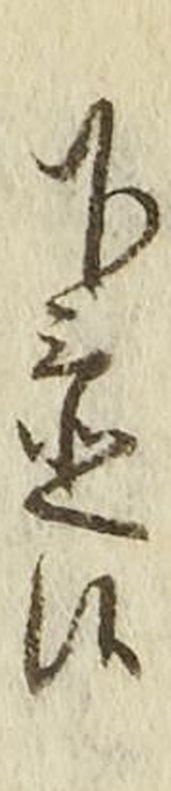下置候
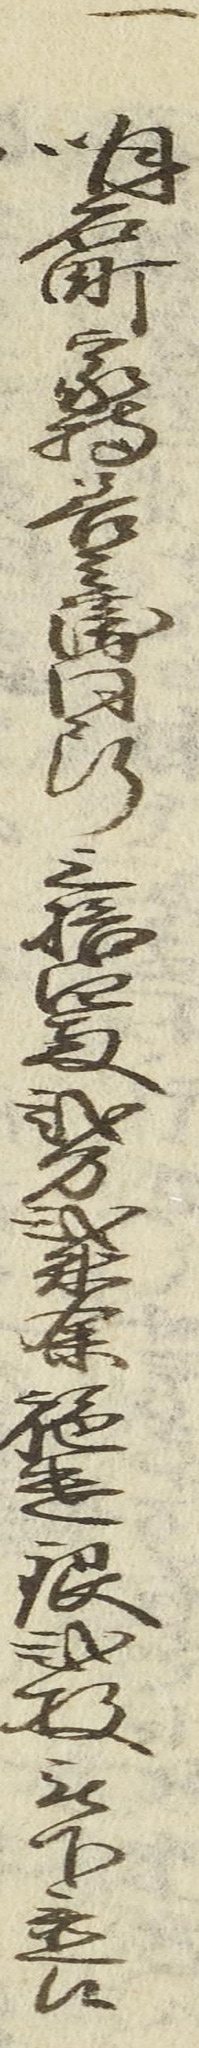一明石町家持善兵衛同断三拾四両弐分弐朱余施遣銀弐枚被下置候
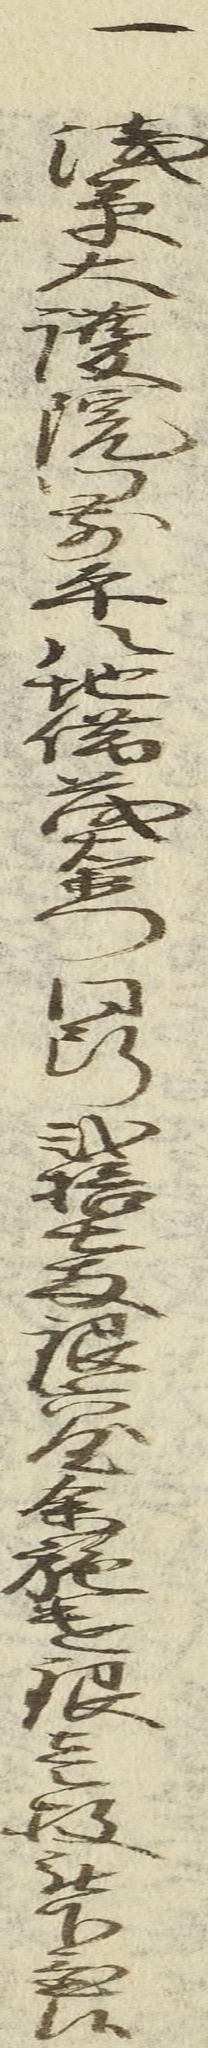一浅草大護院門前平八地借茂右衛門同断弐拾七両銀六匁余施遣銀壱枚被下置候
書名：安政二年震災記事　完
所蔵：東京大学地震研究所図書室 Earthquake Research Institute Library, The University of Tokyo, JAPAN
